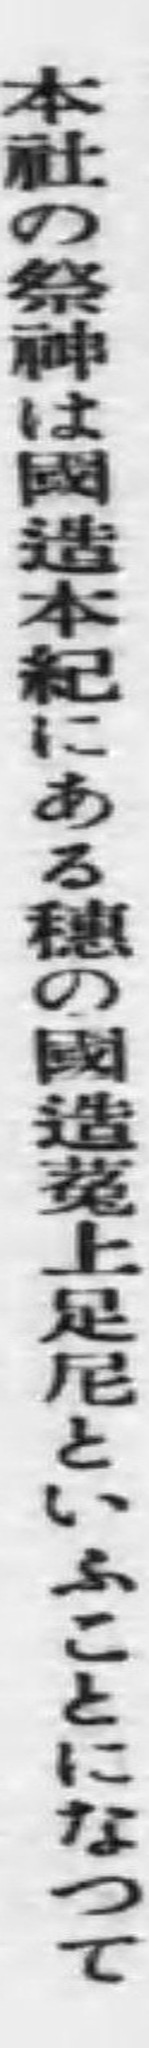本社の祭神は国造本紀にある穂の国造菟上足尼といふことになつて
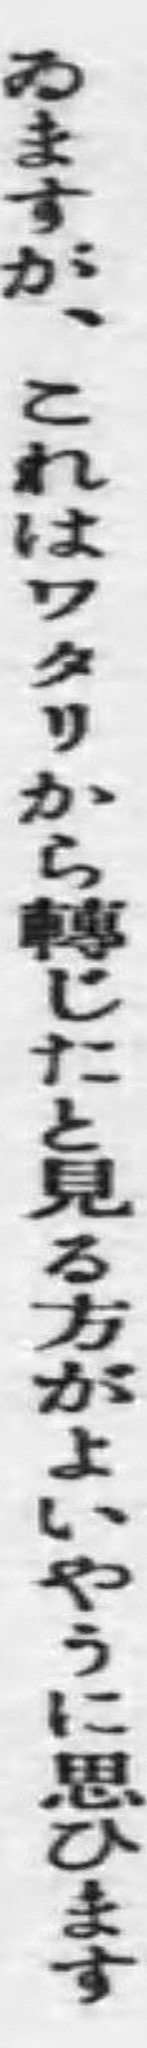ゐますが、これはワタリから転じたと見る方がよいやうに思ひます
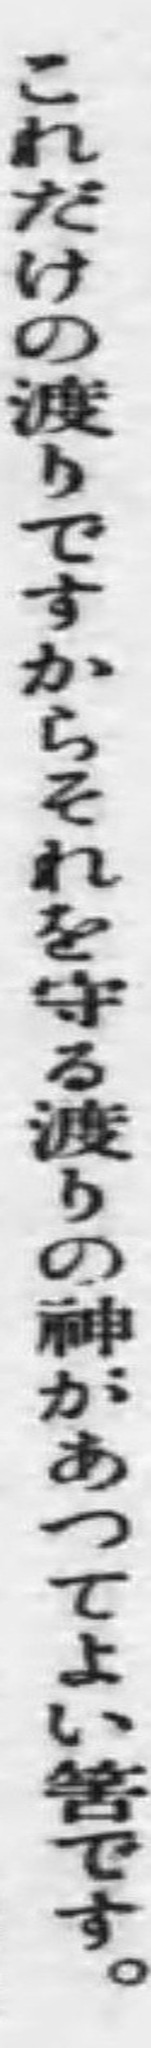これだけの渡りですからそれを守る渡りの神があつてよい筈です。
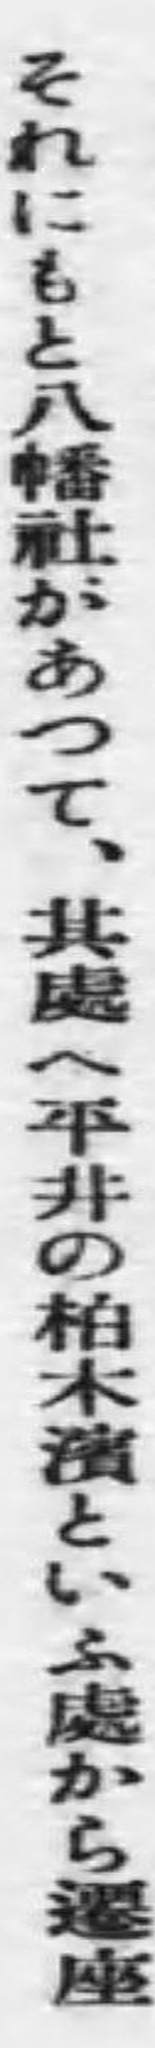それにもと八幡社があつて、其処へ平井の柏木浜といふ処から遷座
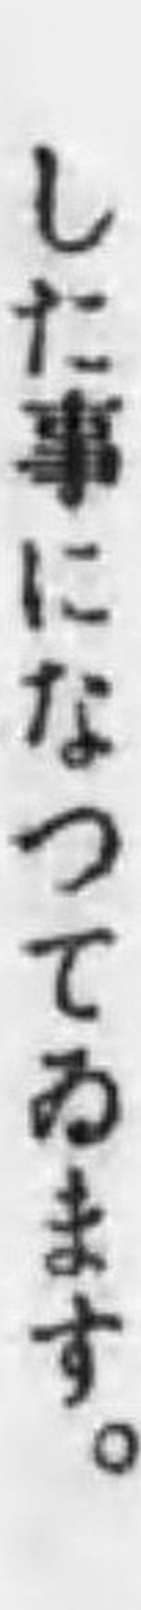した事になつてゐます。
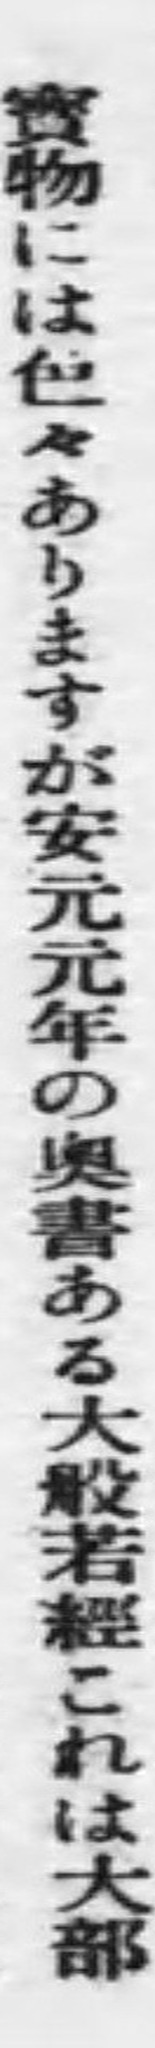宝物には色々ありますが安元元年の奥書ある大般若経これは大部
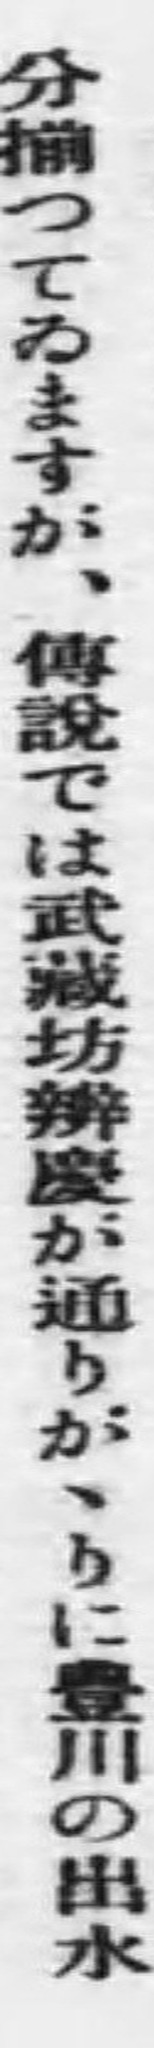分揃つてゐますが、伝説では武蔵坊弁慶が通りがゝりに豊川の出水
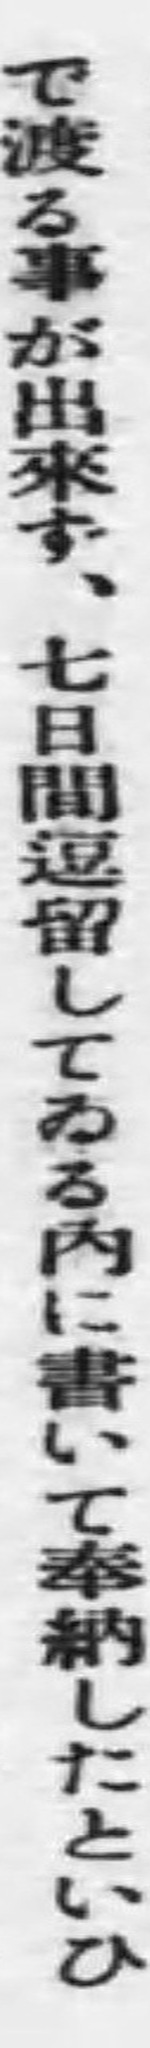で渡る事が出来ず、七日間逗留してゐる内に書いて奉納したといひ
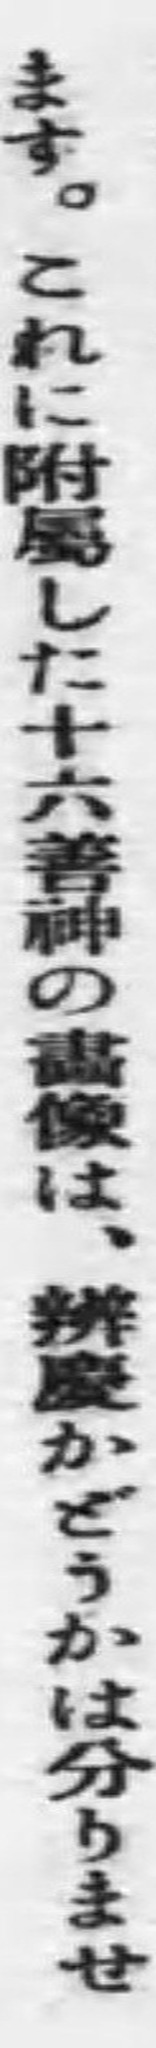ます。これに附属した十六善神の画像は、弁慶かどうかは分りませ
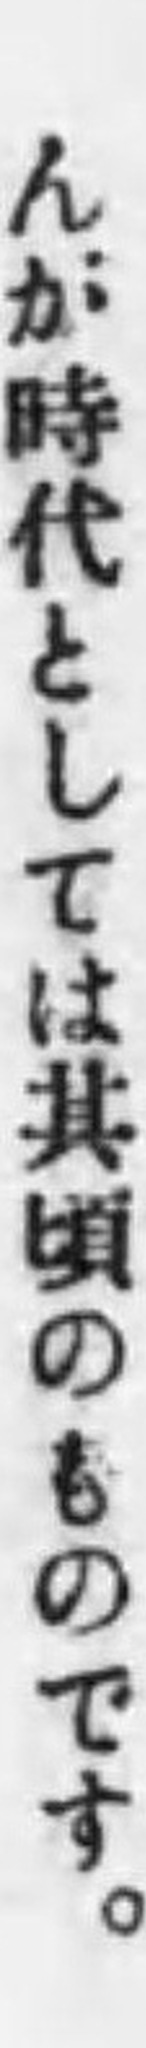んが時代としては其頃のものです。
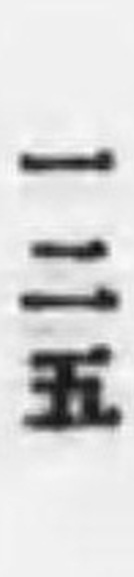一二五

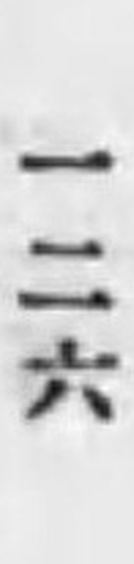一二六
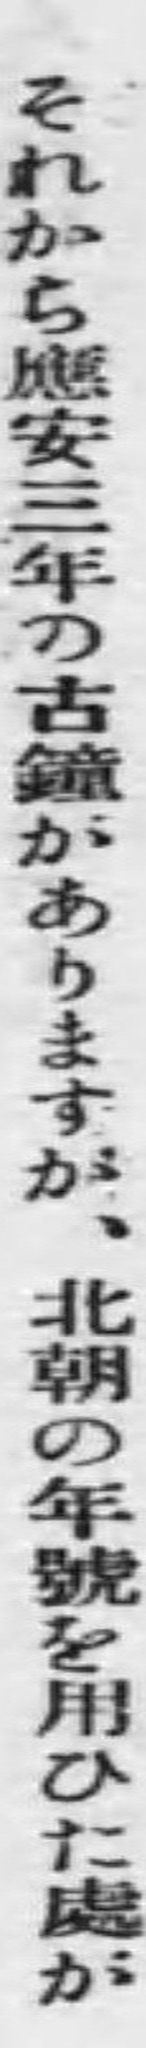それから応安三年の古鐘がありますが、北朝の年号を用ひた処が
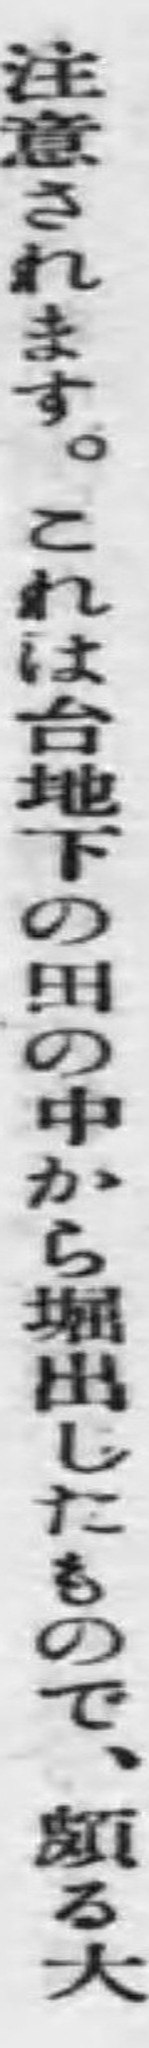注意されます。これは台地下の田の中から堀出したもので、頗る大
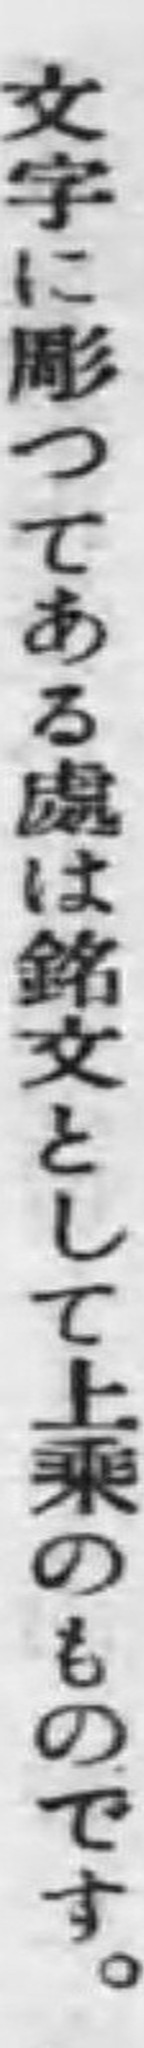文字に彫つてある処は銘文として上乗のものです。
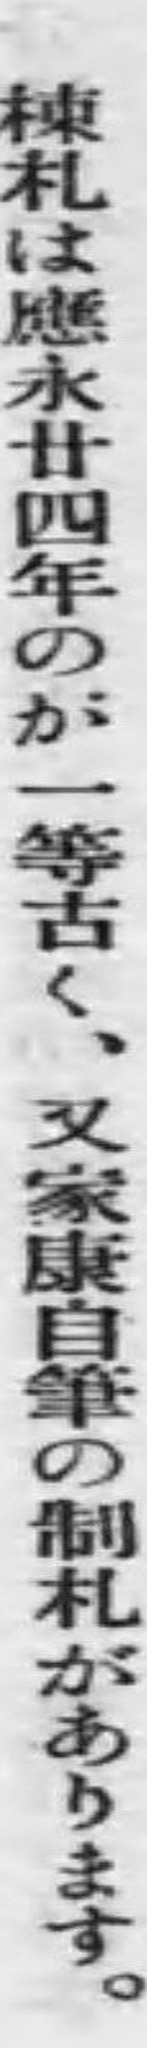棟札は応永廿四年のが一等古く、又家康自筆の制札があります。
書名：東三河道中記 : 豊橋市及其附近案内
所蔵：国立国会図書館 National Diet Library, JAPAN
